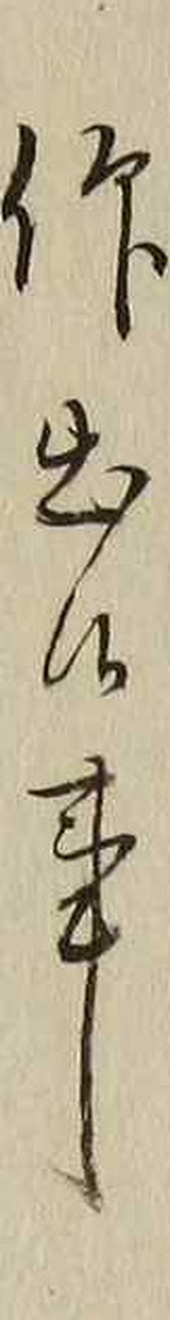仰出候事
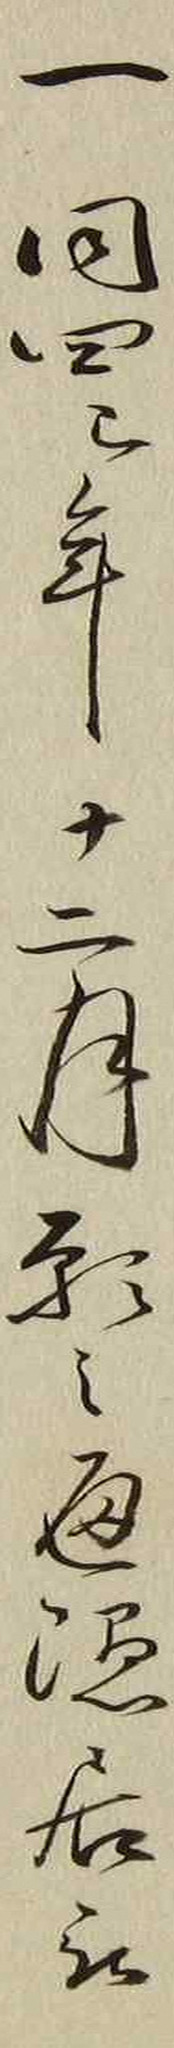一同四巳年十二月願之通隠居被
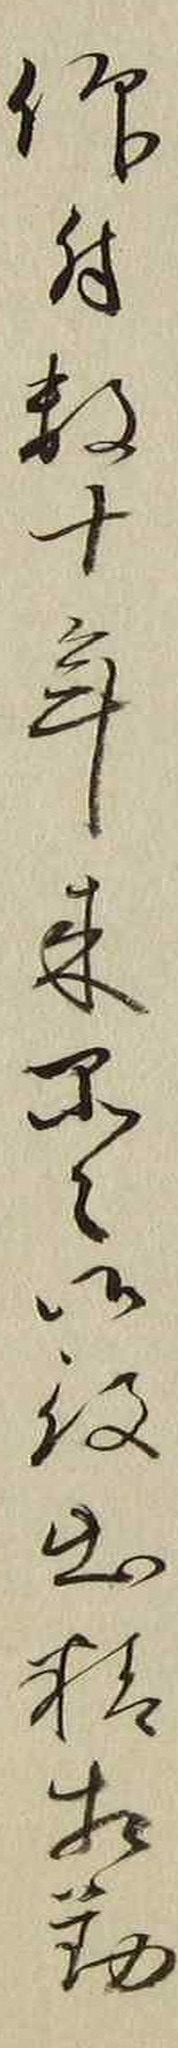仰付数十年来品々御役出精相勤
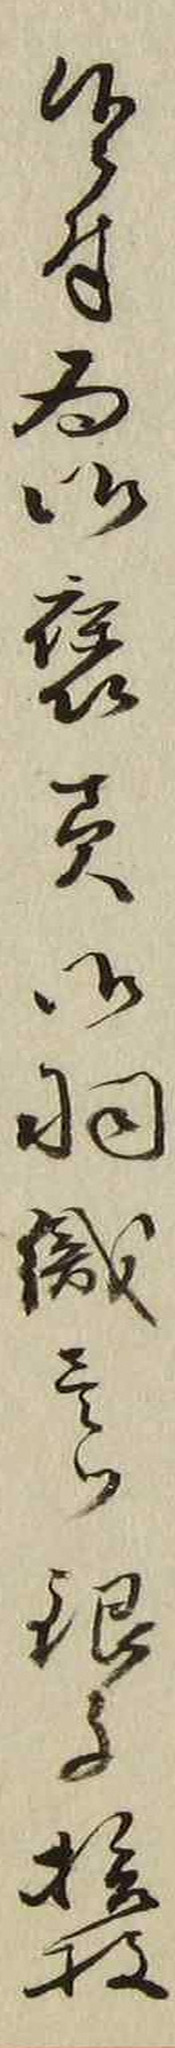候ニ付為御褒美御羽織壱ツ銀子拾枚
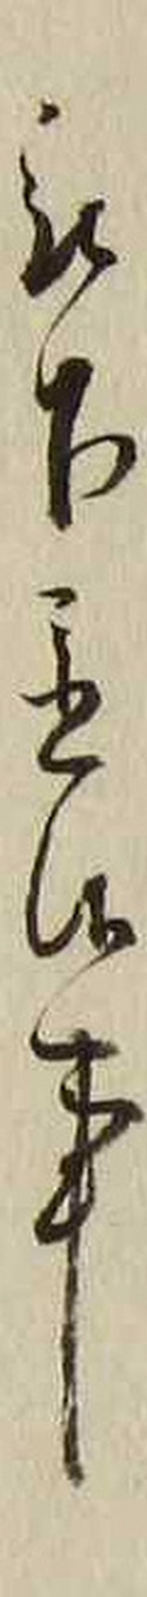被下置候事
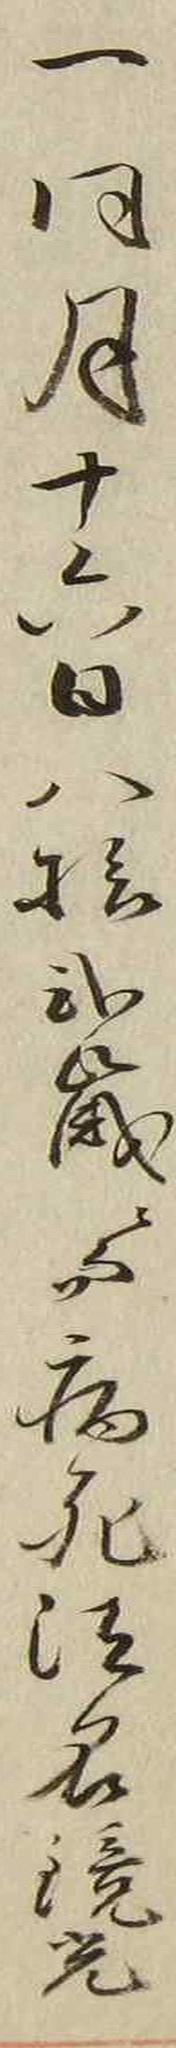一同月十六日八拾弐歳ニ而病死法名鏡光

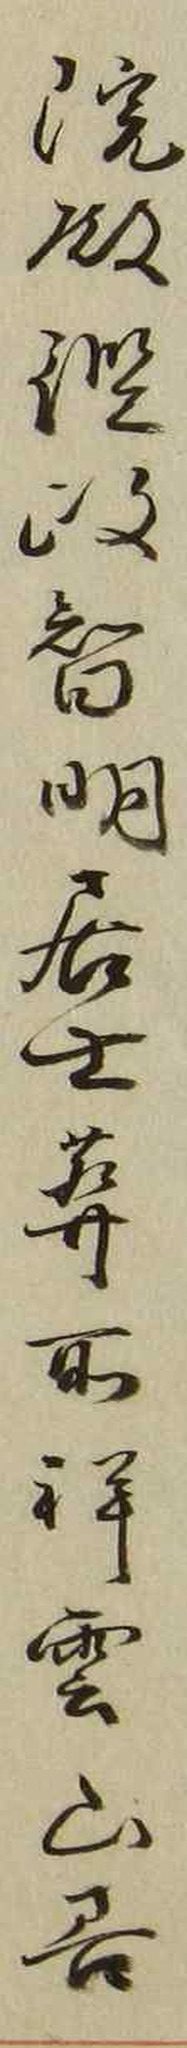院殿鑑政智明居士葬所祥雲山善
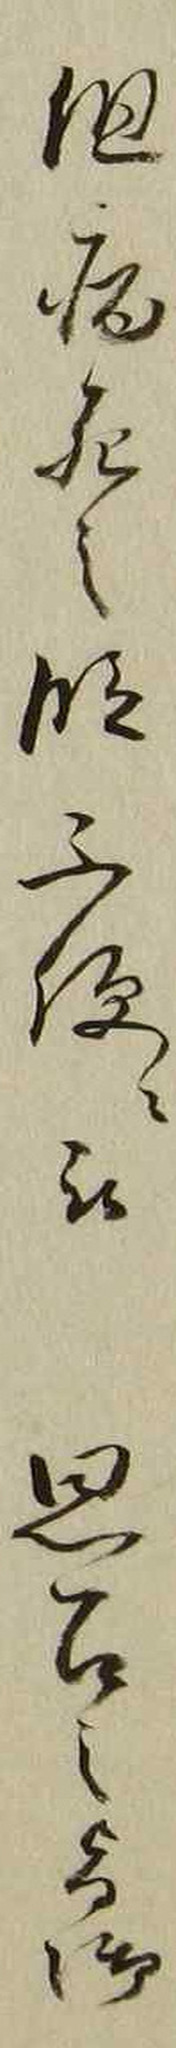但病死之段不便ニ被思召之旨御
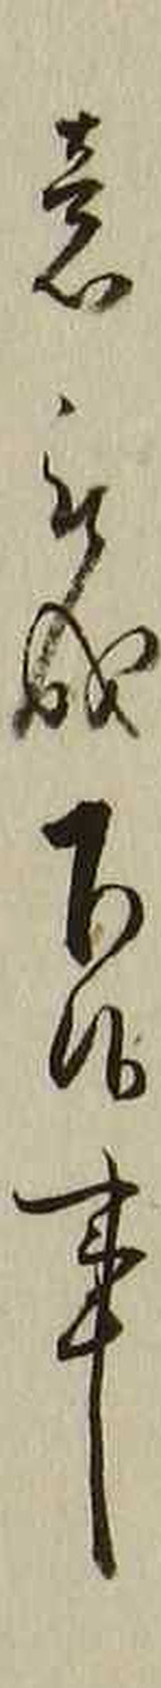意被成下候事
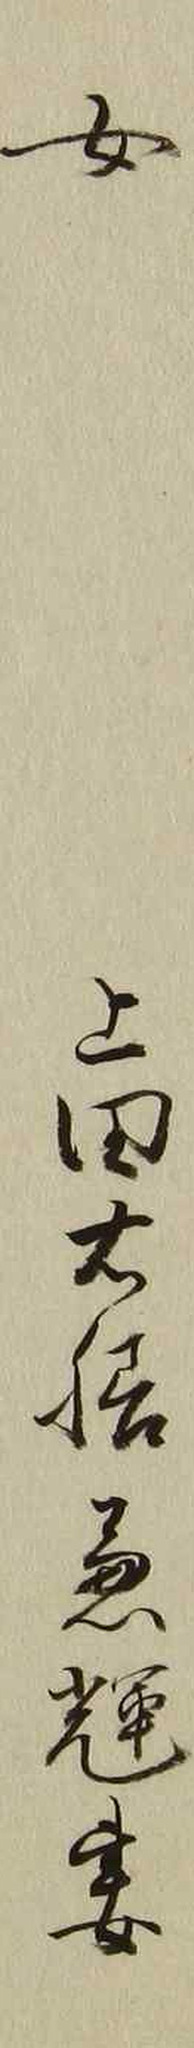女上田右膳兼輝妻
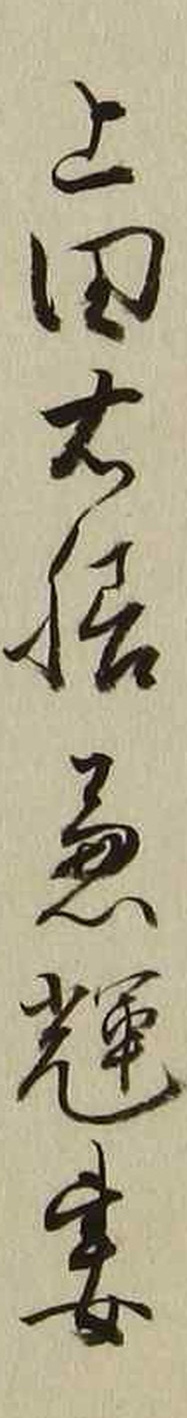女上田右膳兼輝妻
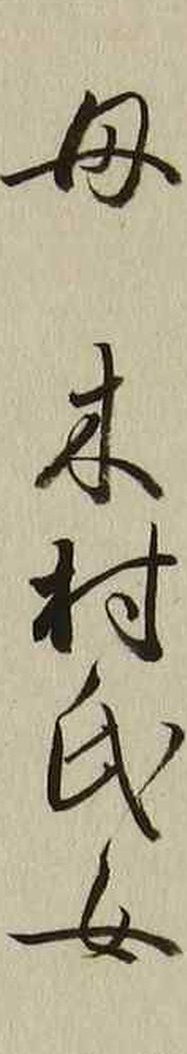母木村氏女
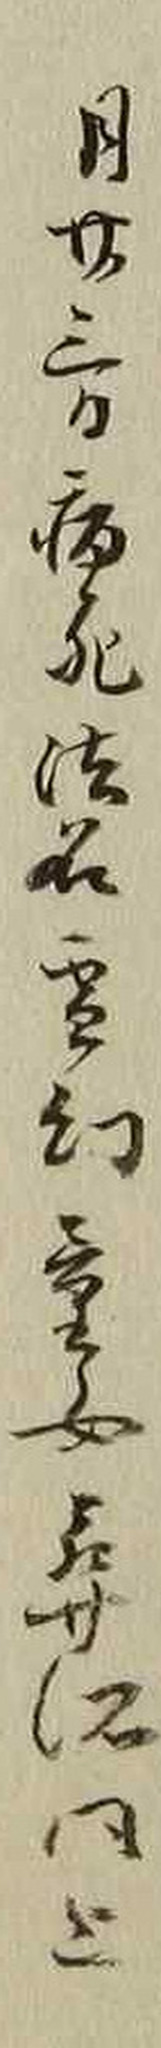月廿三日病死法名雪幻童女葬所同上
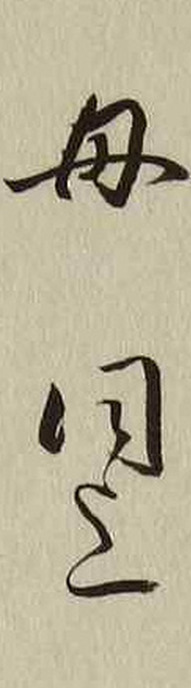母同上
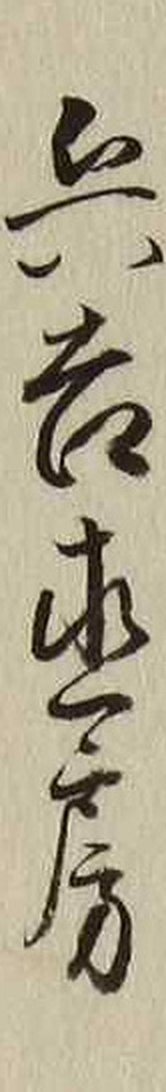兵吉直房
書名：諸士系譜　巻之2　い之部2
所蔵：会津若松市立会津図書館
